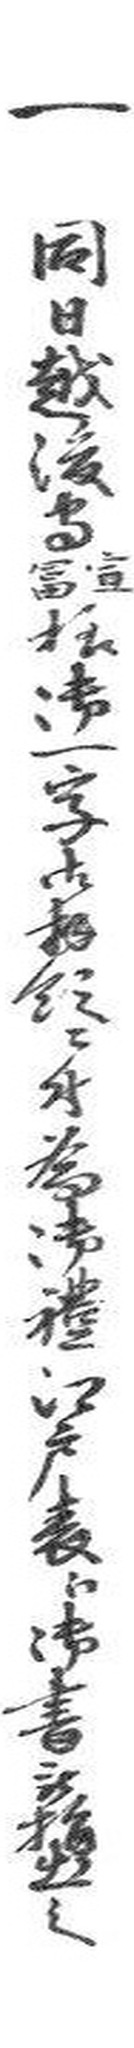一同日越後守宣冨様御一字御拝領ニ付為御礼江戸表江御書被指出之
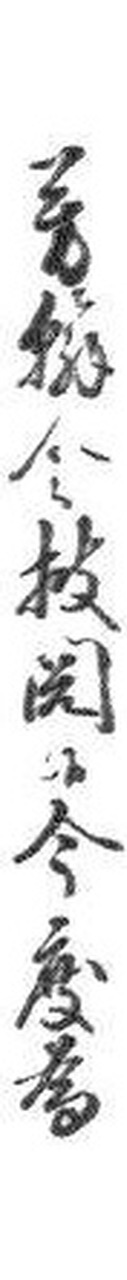芳翰令披閲候今度為
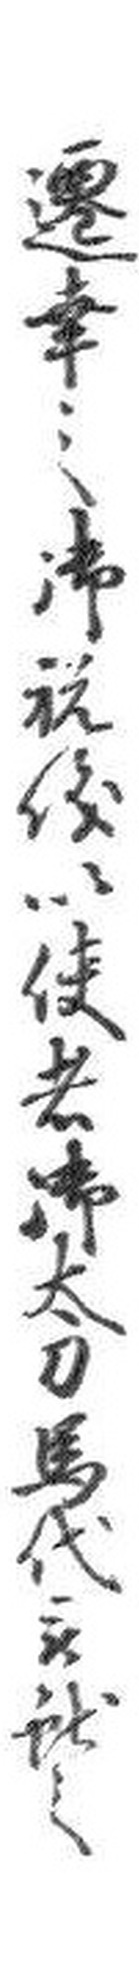遷幸之御祝儀以使者御太刀馬代被献之
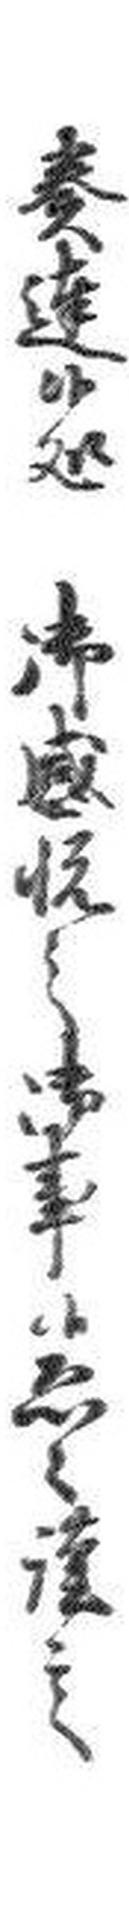奏達候処御感悦之御事候恐々謹言
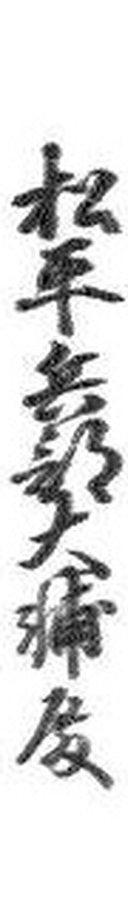松平兵部大輔殿
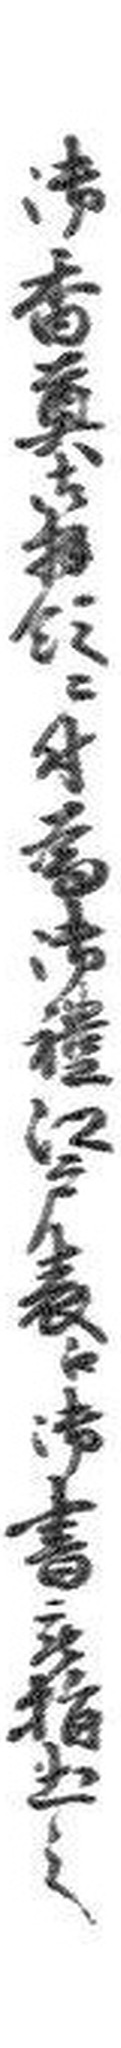御香奠御拝領ニ付為御礼江戸表江御書被指出之

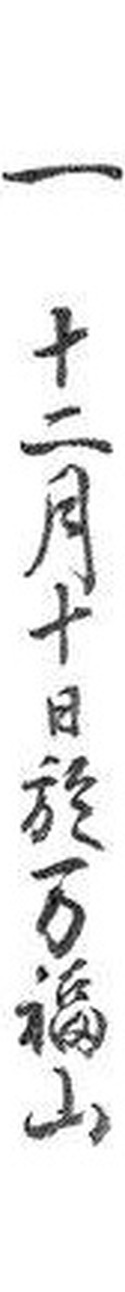一十二月十日於万福山
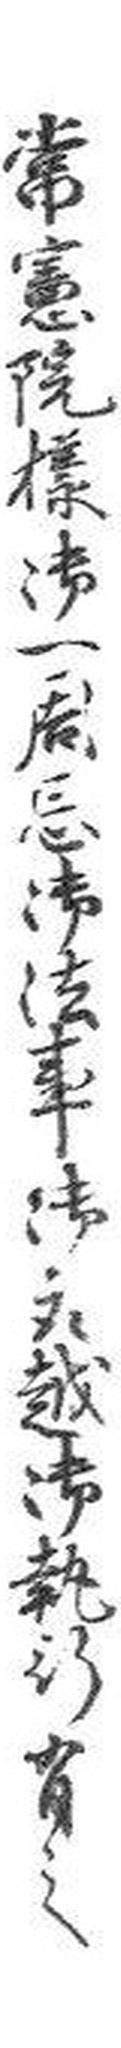常憲院様御一周忌御法事御取越御執行有之
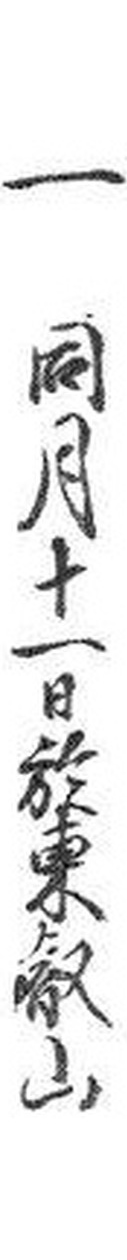一同月十一日於東叡山
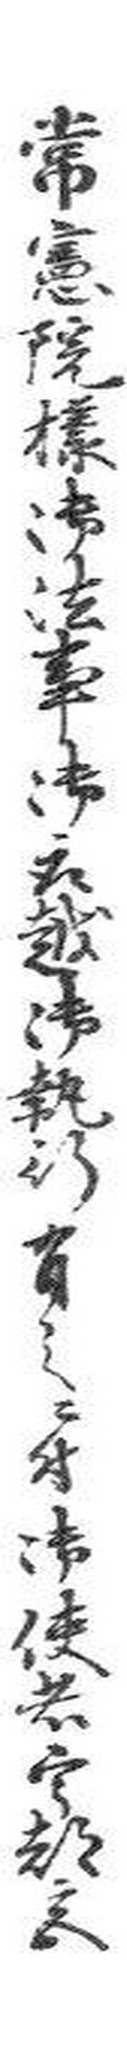常憲院様御法事御取越御執行有之ニ付御使者宇都宮
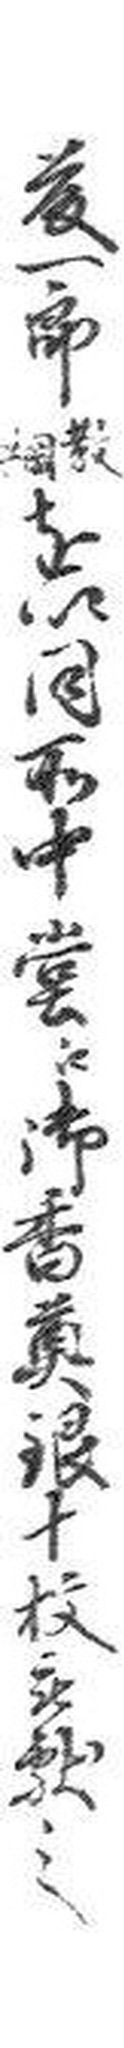藤一郎教綱を以同所中堂江御香奠銀十枚被献之
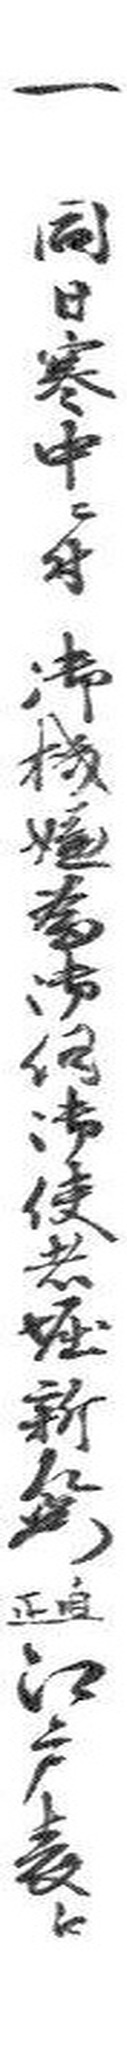一同日寒中ニ付御機嫌為御伺御使者堀新左衛門直正江戸表江
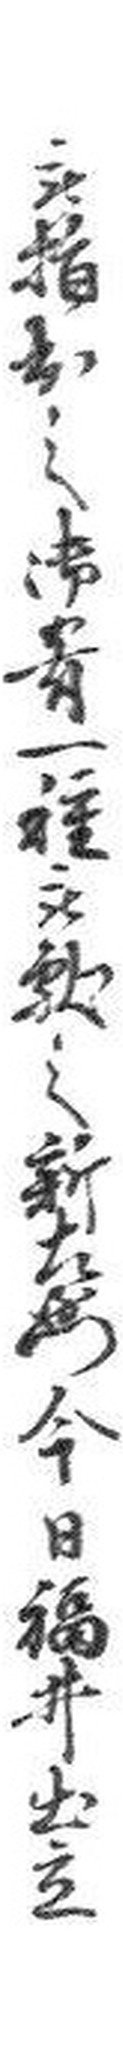被指出之御肴一種被献之新左衛門今日福井出立
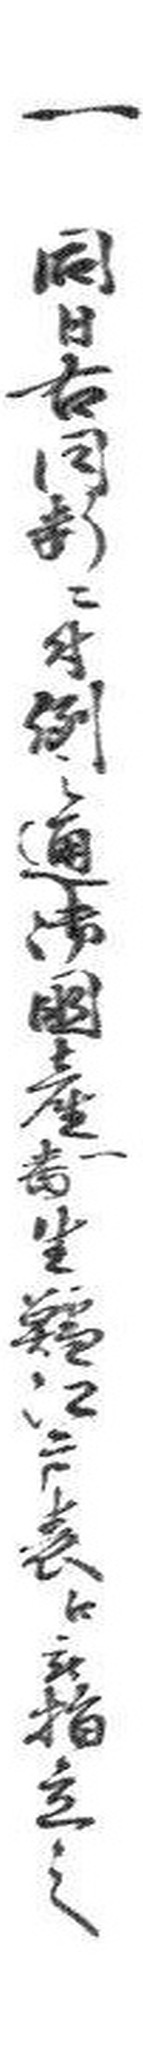一同日右同断ニ付例之通御国産一番生鱈江戸表江被指立之
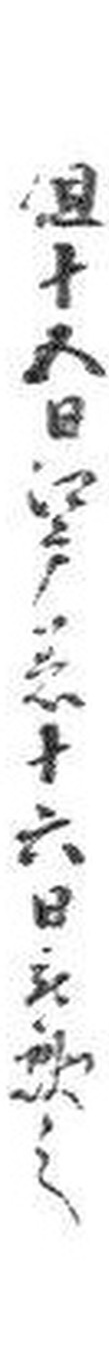但十五日江戸着十六日被献之
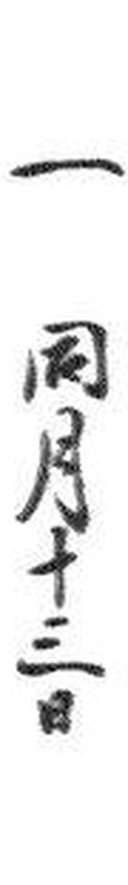一同月十三日
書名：家譜 二十五 吉品公 従宝永六年到同七年
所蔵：福井県文書館 Fukui Prefectural Archives
